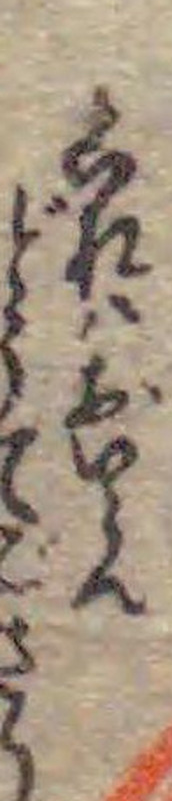これはおいらん
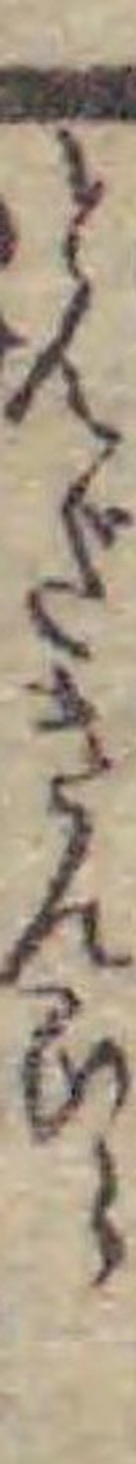とんだきんひら
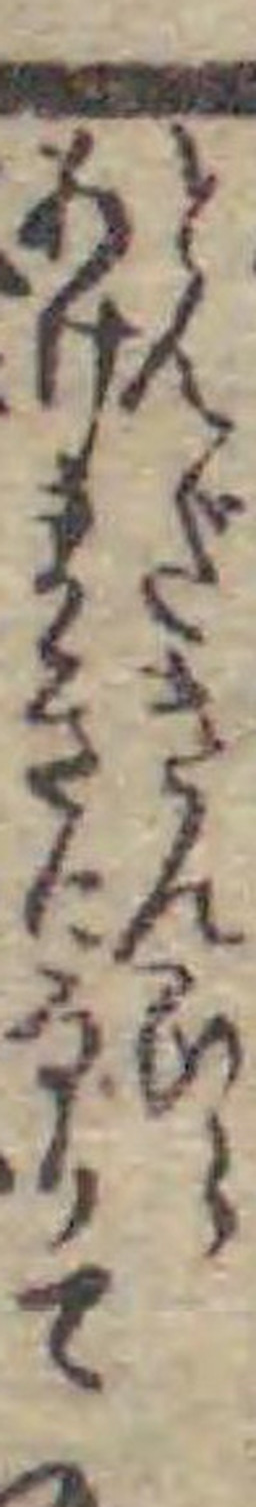あけまきになりて
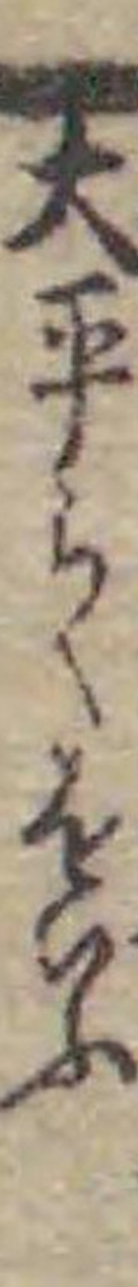太平らくをいふ
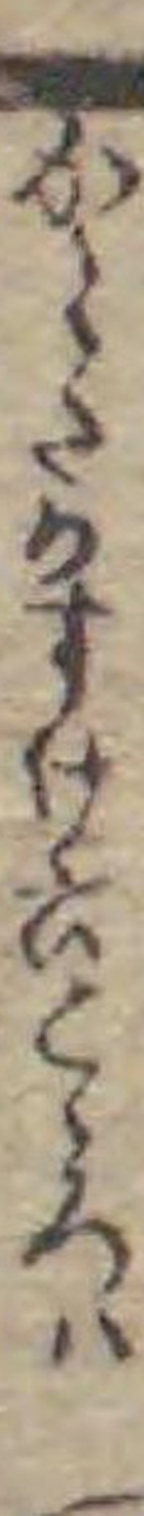からたかすけ六こゝろは
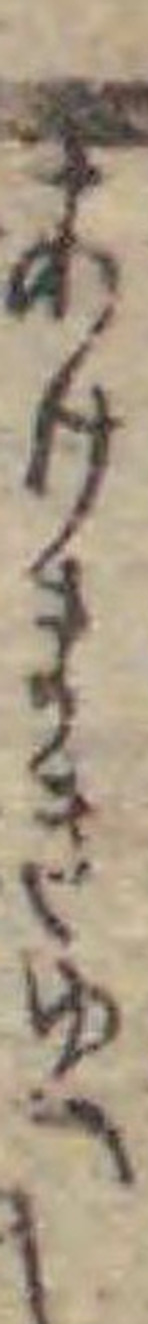あけまきゆへ
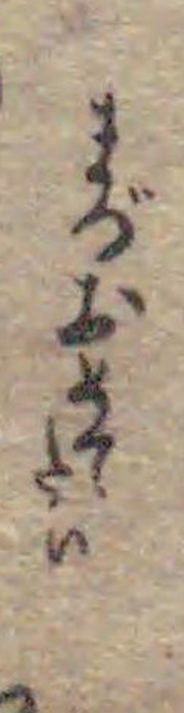まづおめて
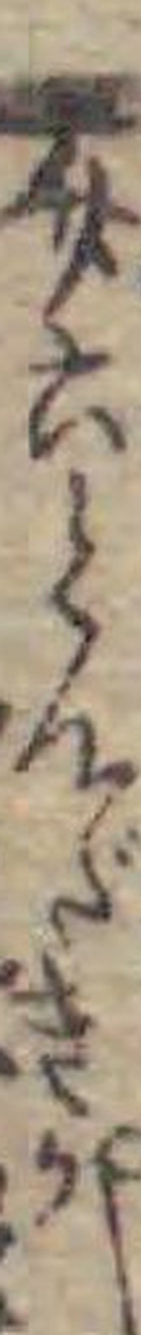介六とんだきか
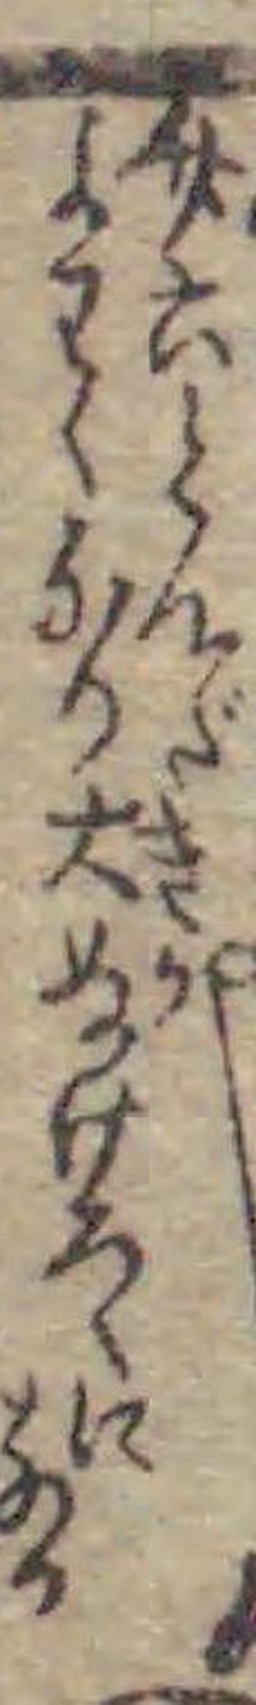よわくなり大ぬけろくになる

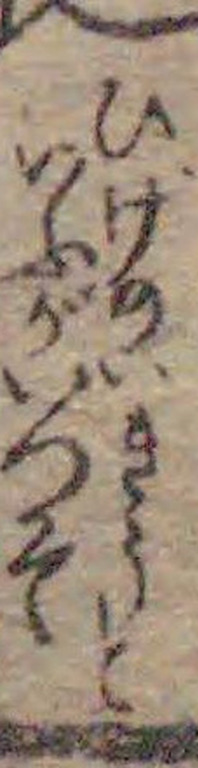いふがいつそ
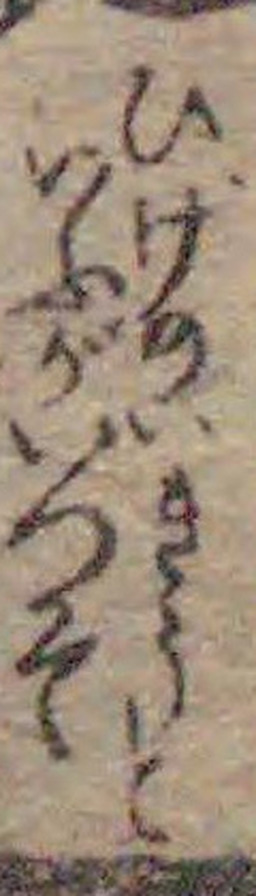いふがいつそ
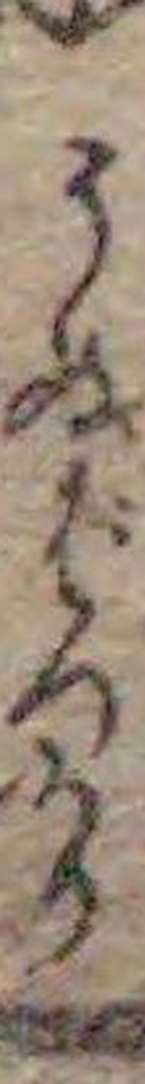うぬばつかり
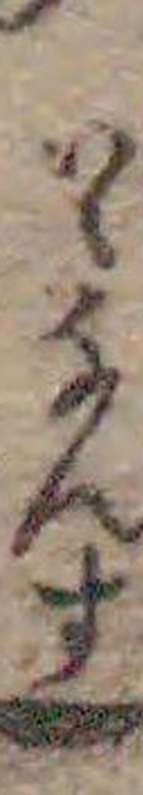いゝなんす
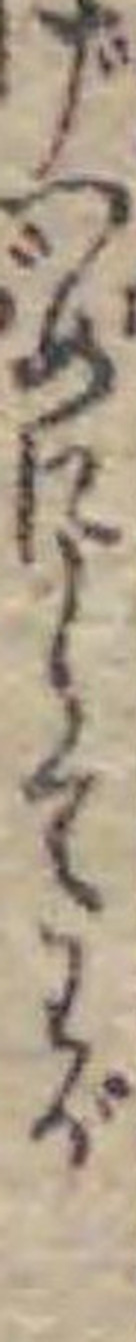げつめにしてわが
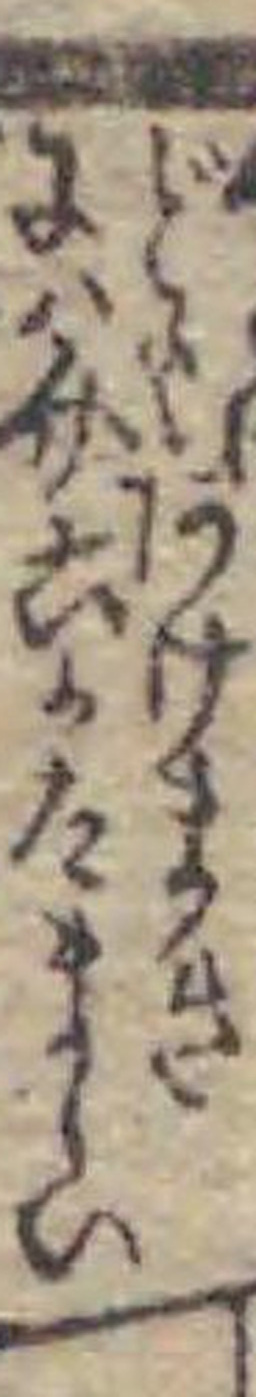には介六かたましい
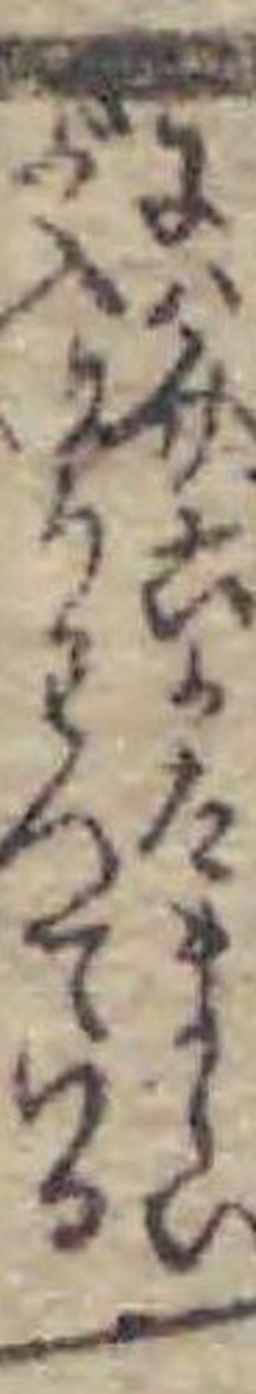が入りかわつている
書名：江戸花俳優贔屓 : 3巻
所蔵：国立国会図書館 National Diet Library, JAPAN
